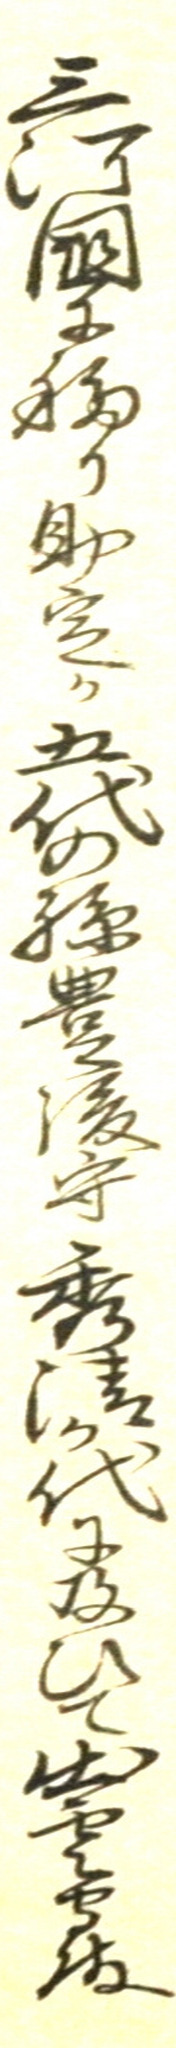三河国に移り助定か五代の孫豊後守秀清か代に及ひて出雲守殿
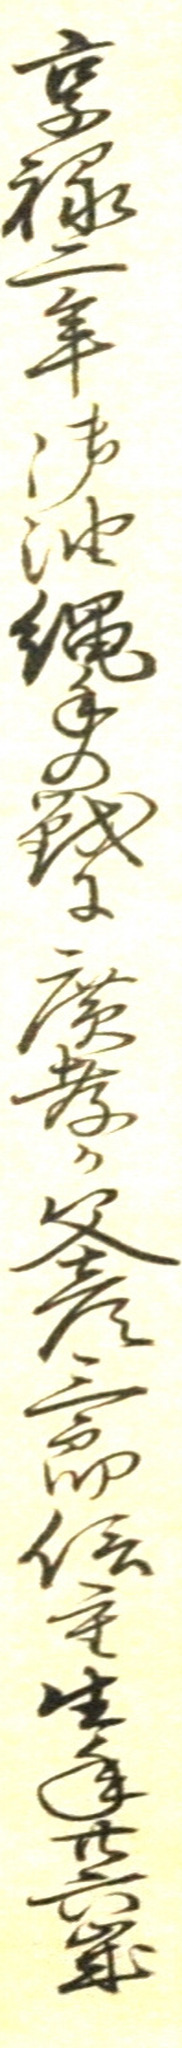享禄二年御油縄手の戦に廣孝か父彦三郎信重生年廿六歳
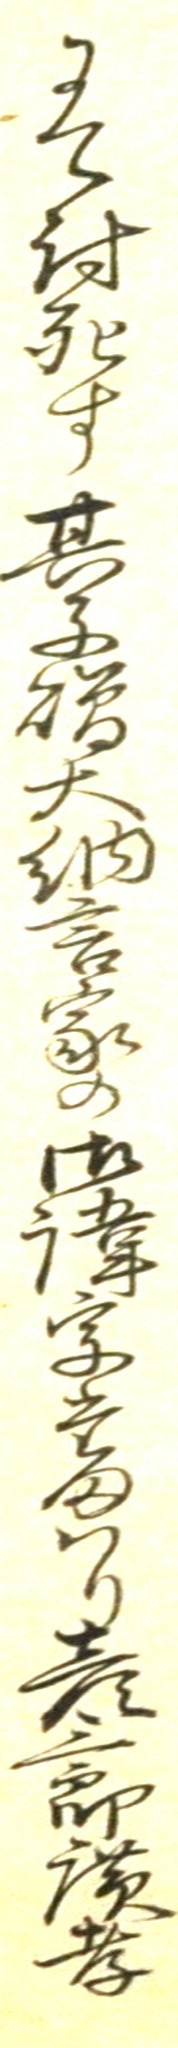にて討死す其子贈大納言家の御諱字たまはり彦三郎廣孝
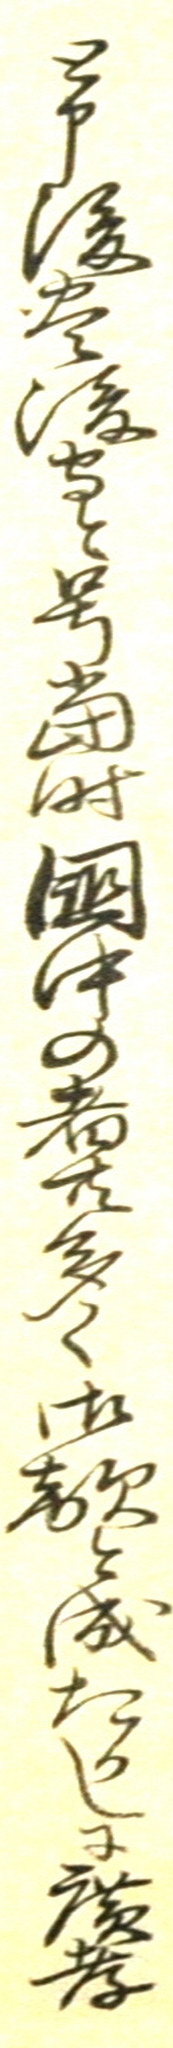と申後豊後守と号当時国中の者共多く御敵と成たりしに廣孝
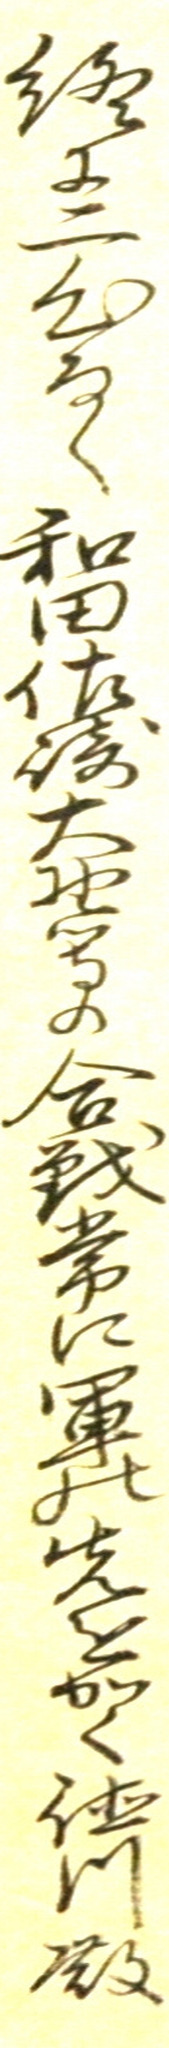終に二心なく和田佐崎大野等の合戦常に軍の先をかく徳川殿

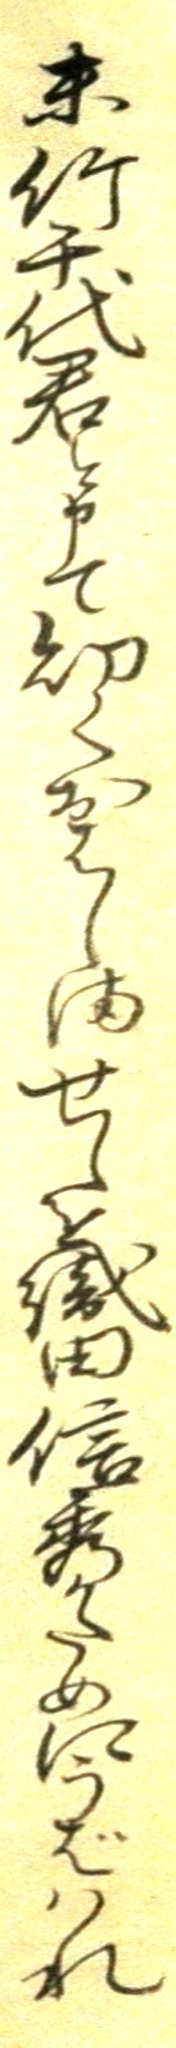未竹千代君と申て幼くおはしませしを織田信秀かためにうばはれ
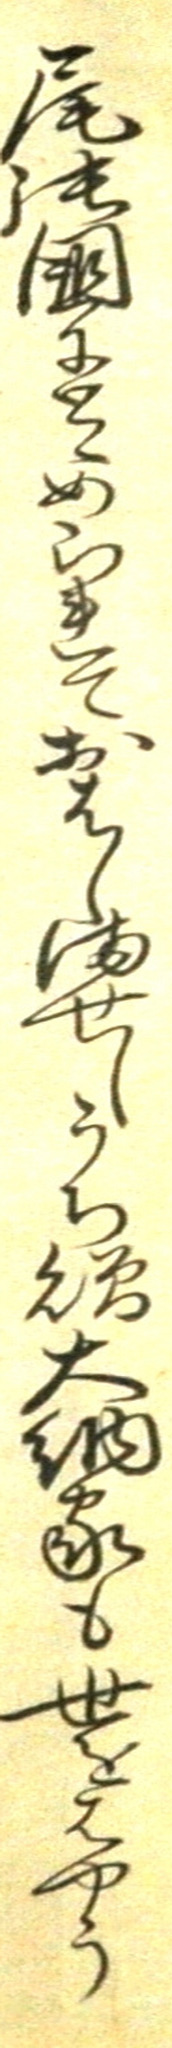尾張国にとゝめられておはしませしうち贈大納家も世をはやう
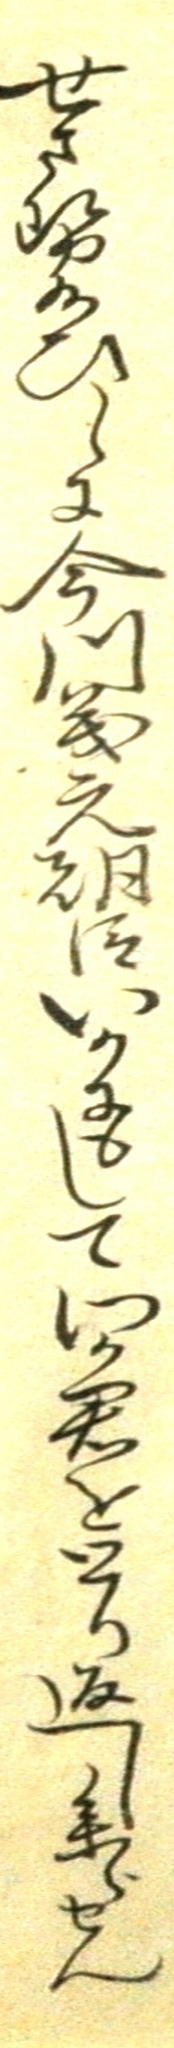せさせ給ひしに今川義元朝臣いかにもしてわか君をとり返し参らせん
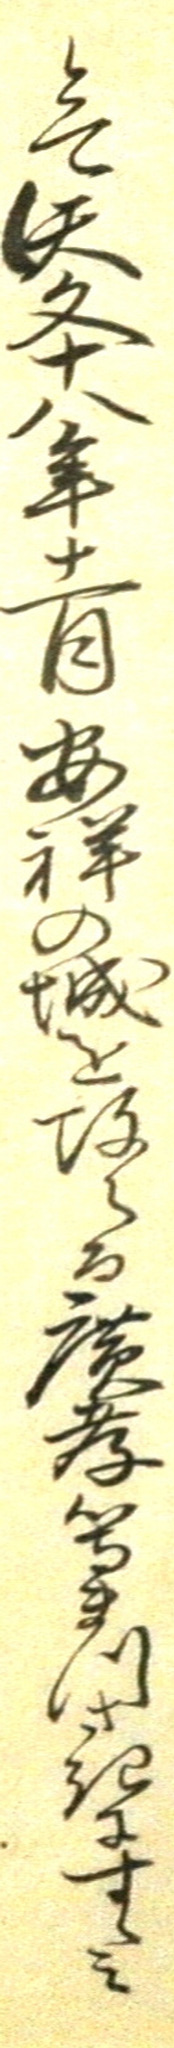とて天文十八年十一月安祥の城を攻らる廣孝等まつさきにすゝみ
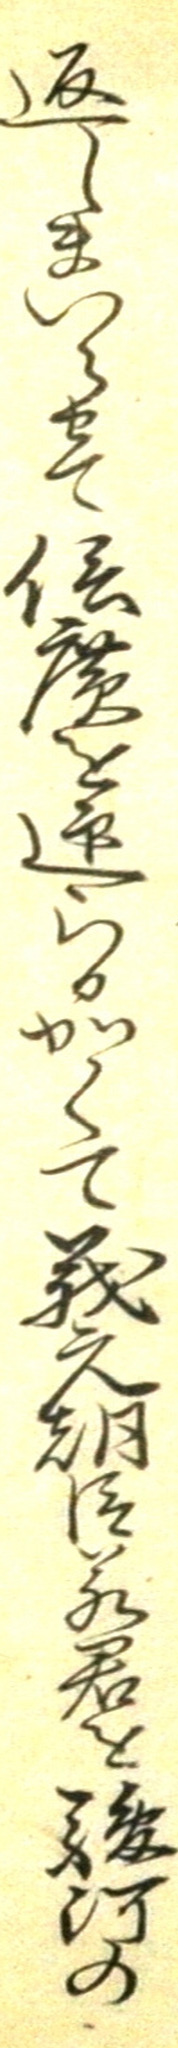返しまいらせて信廣を迎らるかくて義元朝臣若君を駿河の
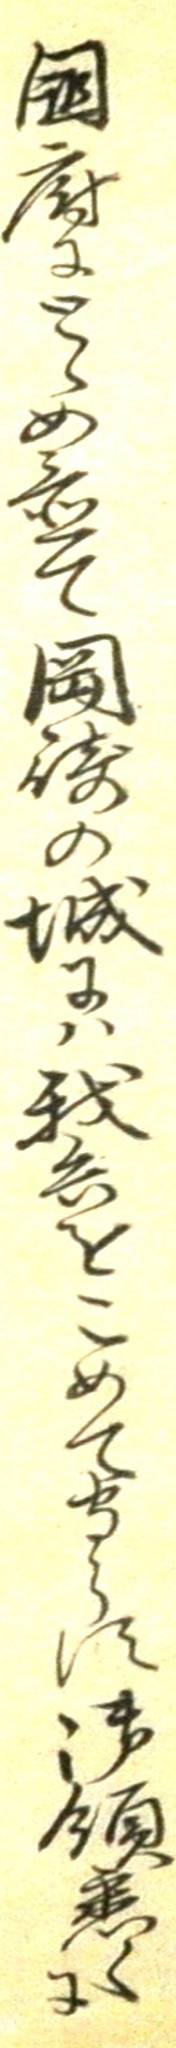国府にとゝめ置て岡崎の城には我兵をこめて守らす御領悉くに
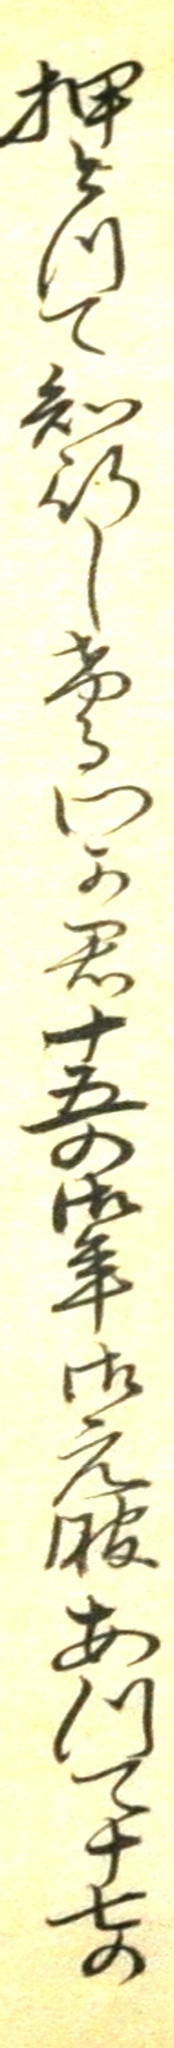押とつて知行しけるわか君十五の御年御元服あつて十七の
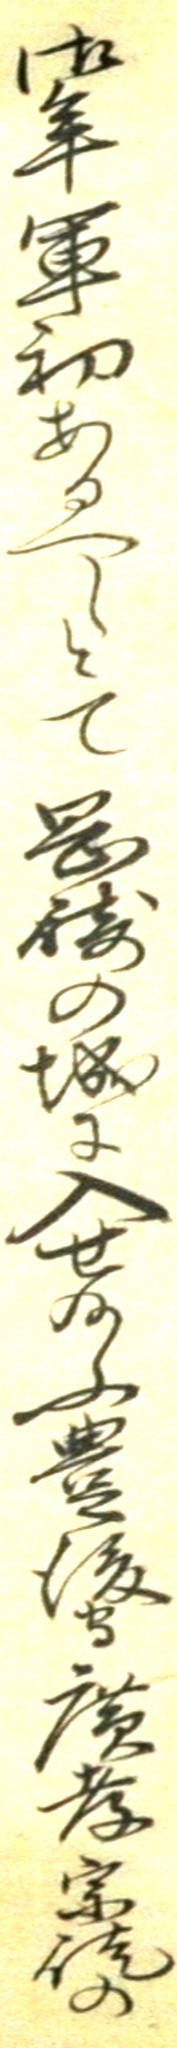御年軍初あるへしとて岡崎の城に入せ給ふ豊後守廣孝宗徒の
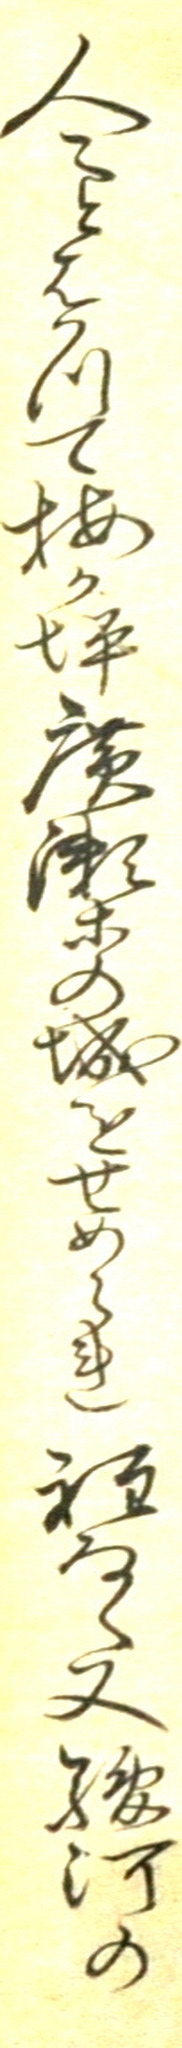人々とはかつて梅か坪広瀬等の城をせめられ程なく又駿河の
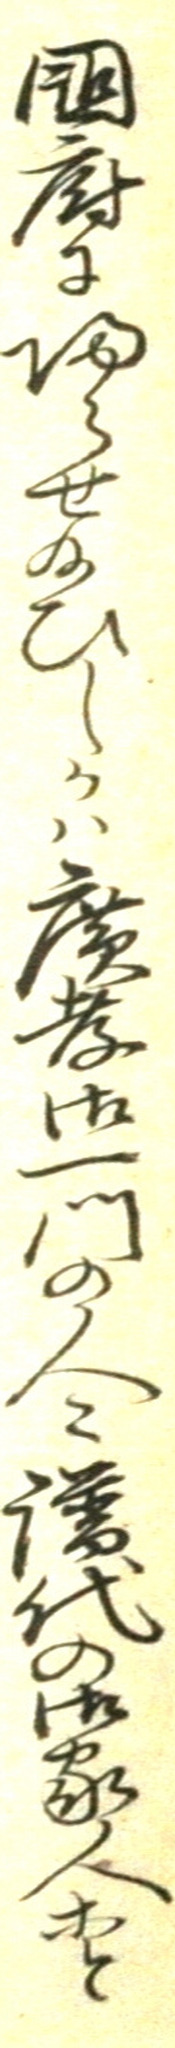国府に帰らせ給ひしかは廣孝御一門の人々普代の御家人等と
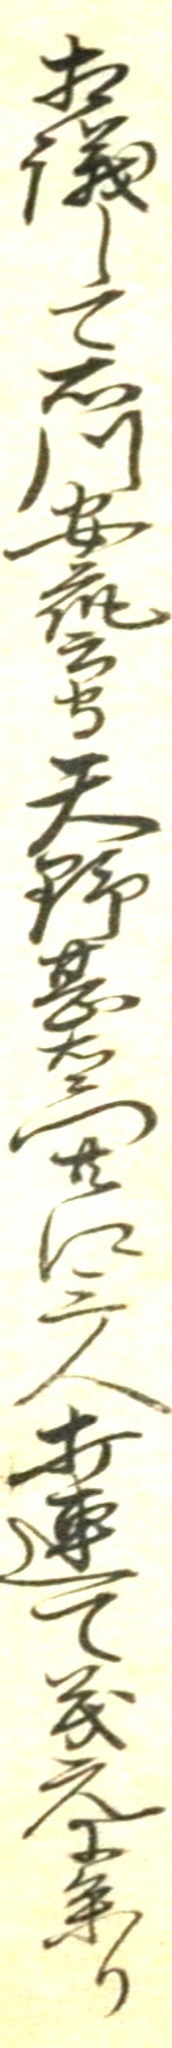相議して石川安芸守天野甚右ヱ門共に三人打連て義元に参り
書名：藩翰譜（四・上）
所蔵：伊那市立高遠町図書館・合同会社AMANE
